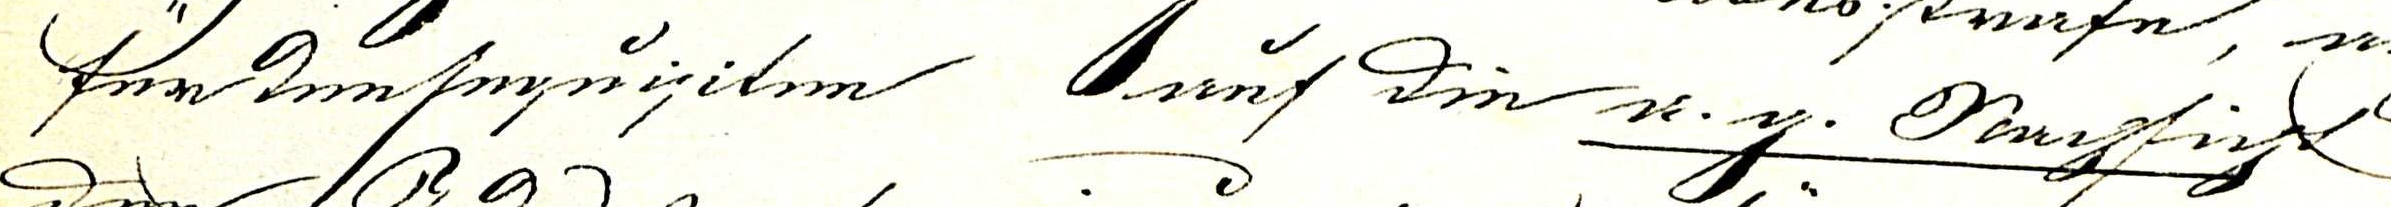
für den Inquisiten auf die a.g. Nachsicht
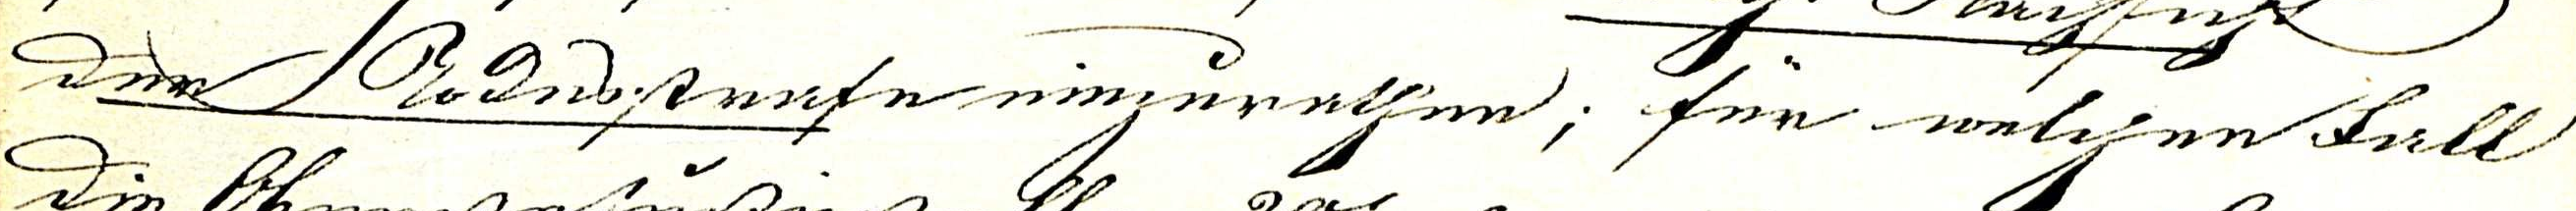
der Todesstrafe einzurathen; für welchen Fall
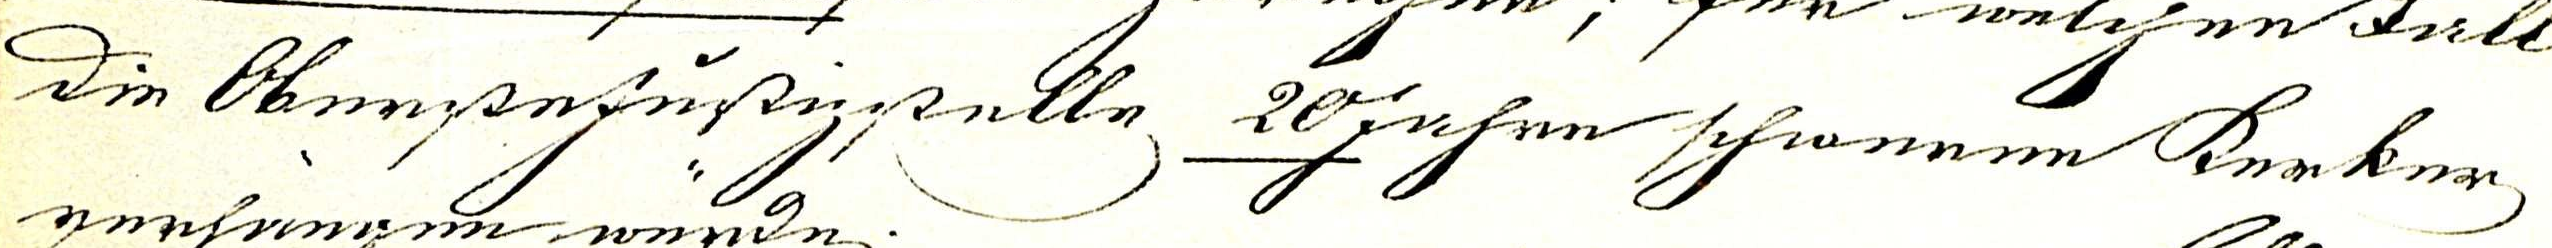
die Oberste Justizstelle 20 Jahre schweren Kerker
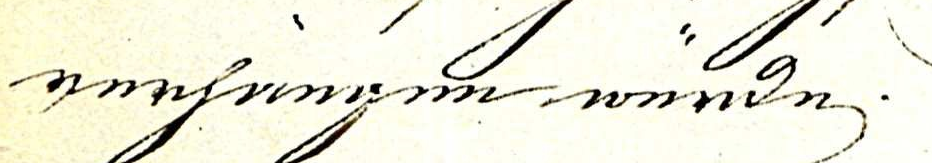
verhängen würde.
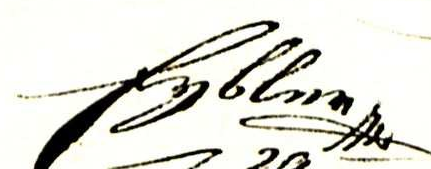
Eybler
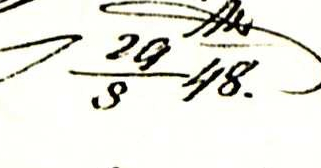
29/3 48
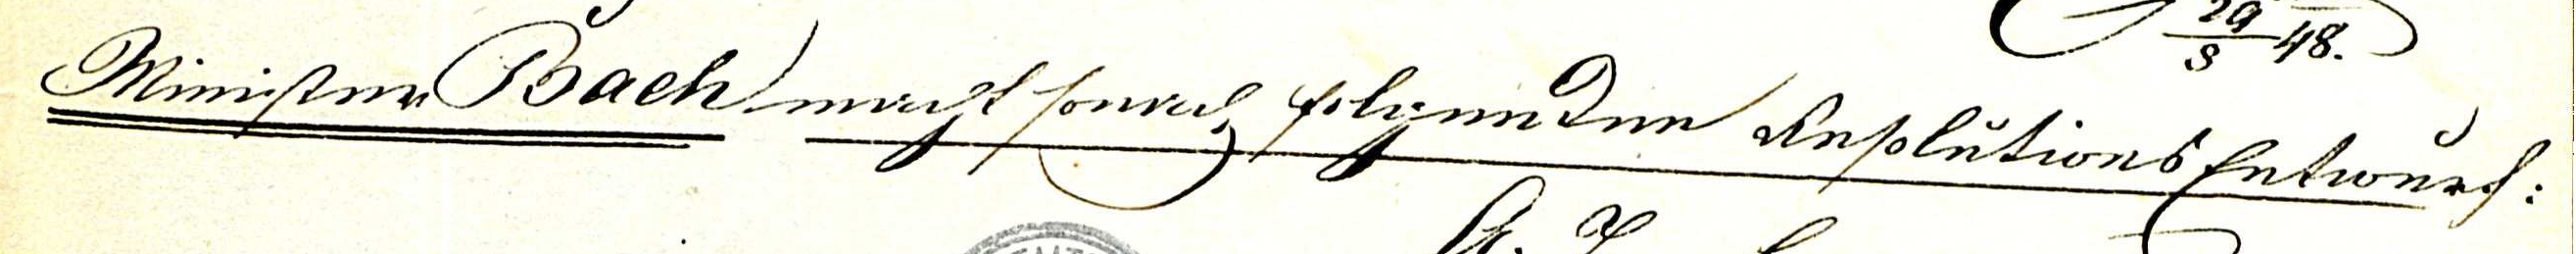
Minister Bach macht sonach folgender Resolutions Entwurf
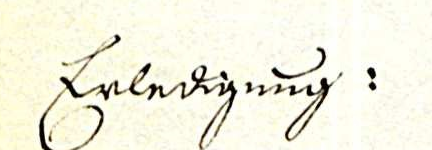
Erledigung
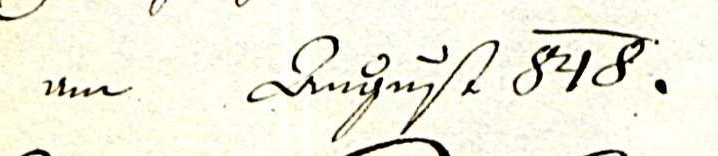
am August [1]848
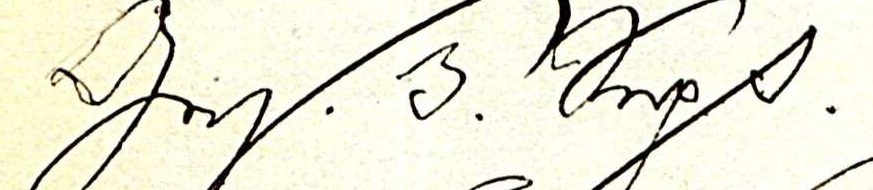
Ges. 3 Sept.
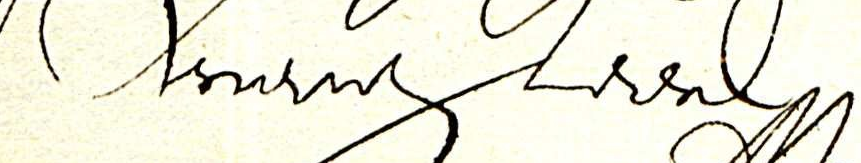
Franz Karl
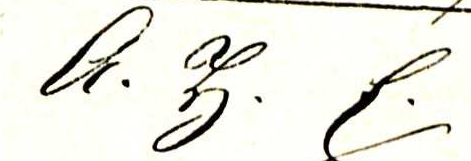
Ah.E.
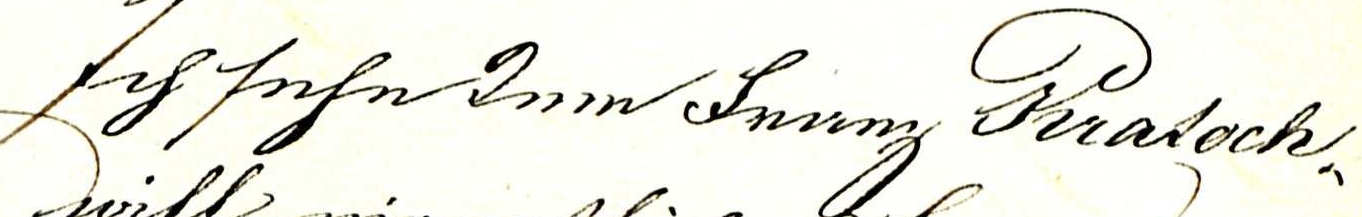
Ich sehe aus Gnade dem Franz Kratoch¬
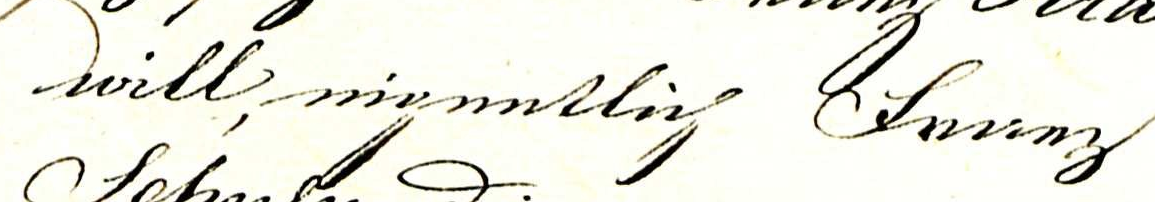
will, eigentlich Franz
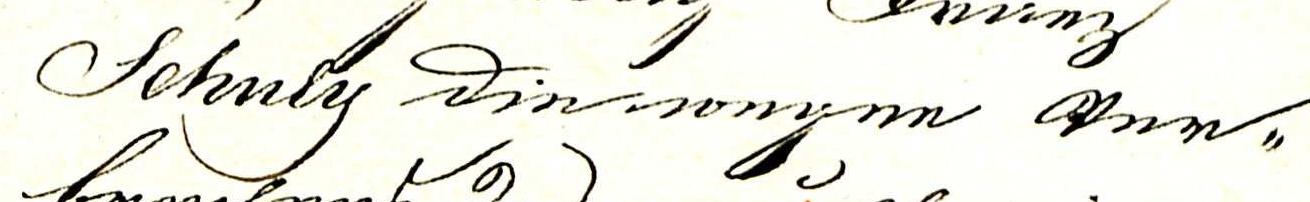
Schulz [looks like Schuly] die wegen Ver¬
